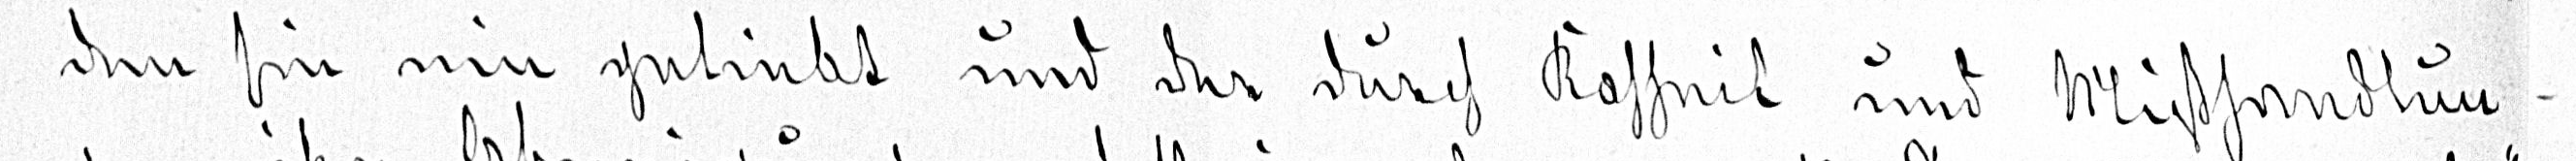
den sie ein geliebt und der durch Rohheit und Mißhandlun¬
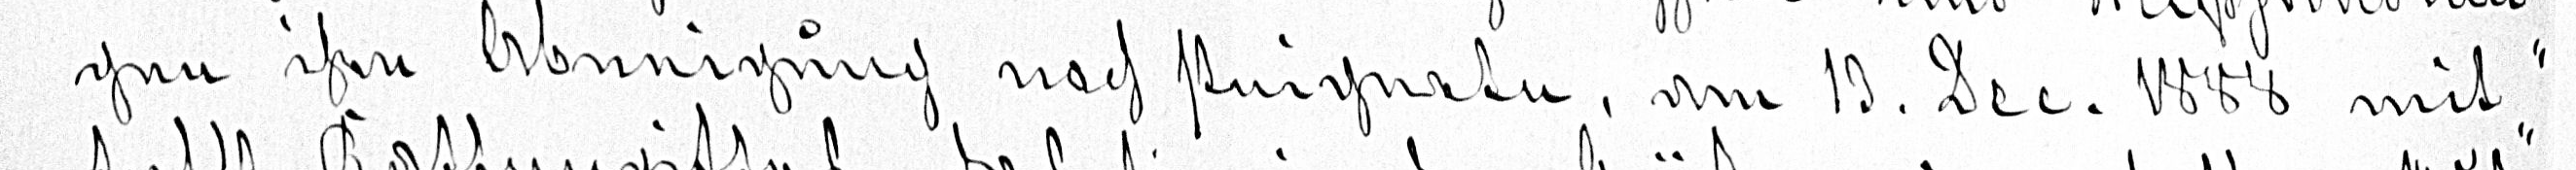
gen ihre Abneigung noch steigerte, am 13. Dec. 1888 mit¬
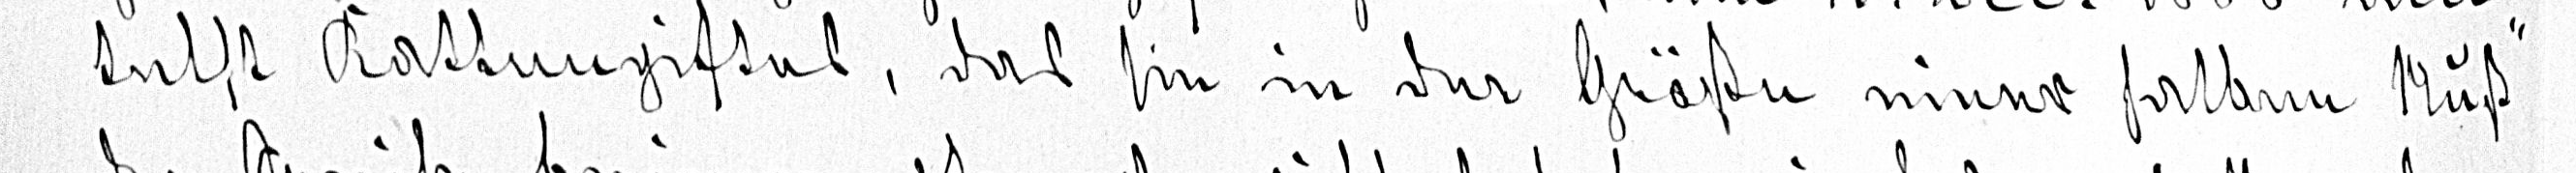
telst Rattengiftes, das sie in der Größe einer halben Nuß
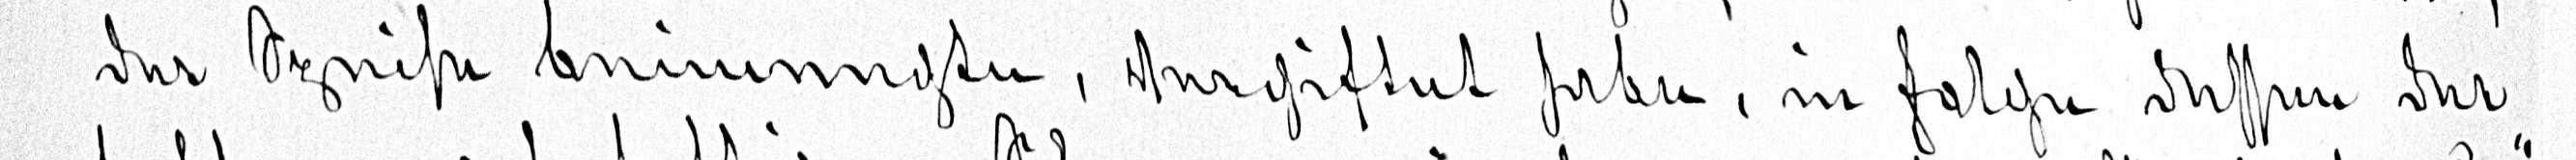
der Speise beimengte, vergiftet habe, in Folge dessen der¬
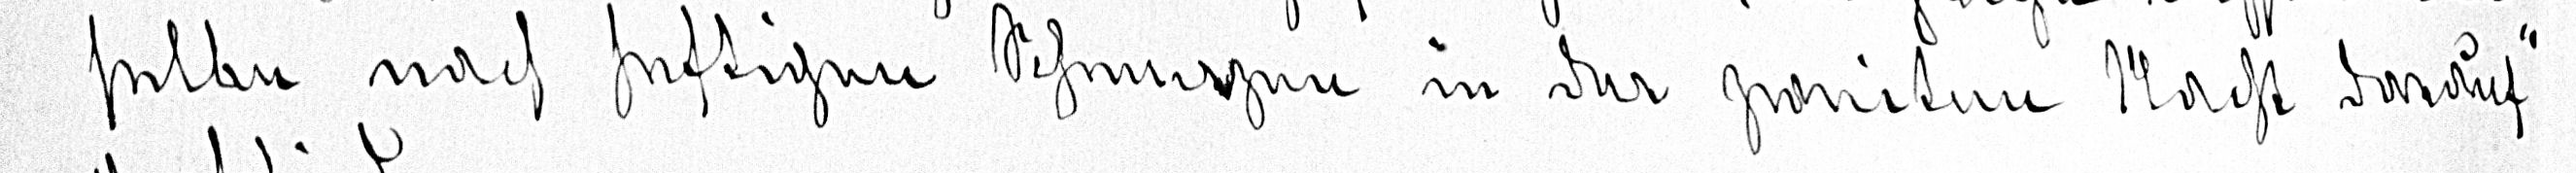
selbe nach heftigen Schmerzen in der zweiten Nacht darauf
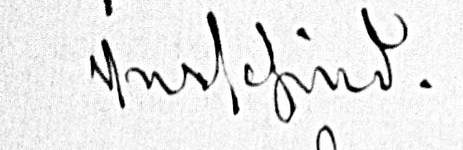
verschied.
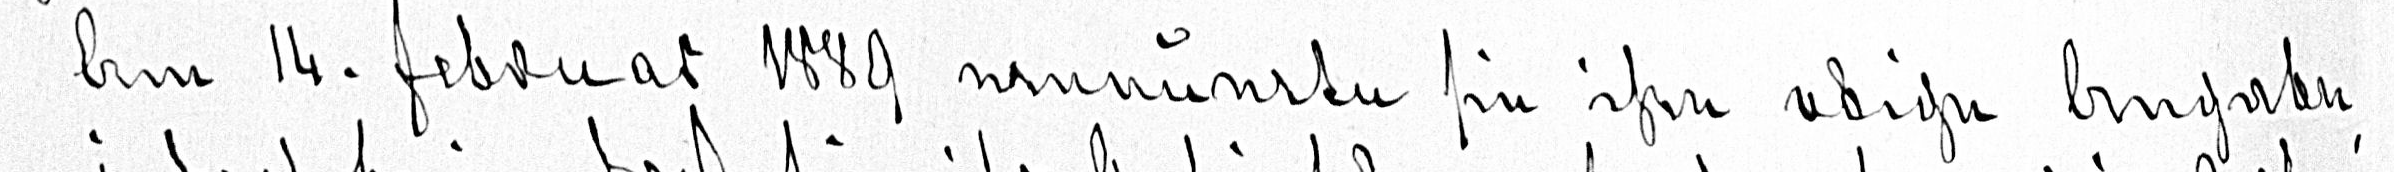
Am 14. Februar 1889 erneuerte sie ihre obige Angabe,
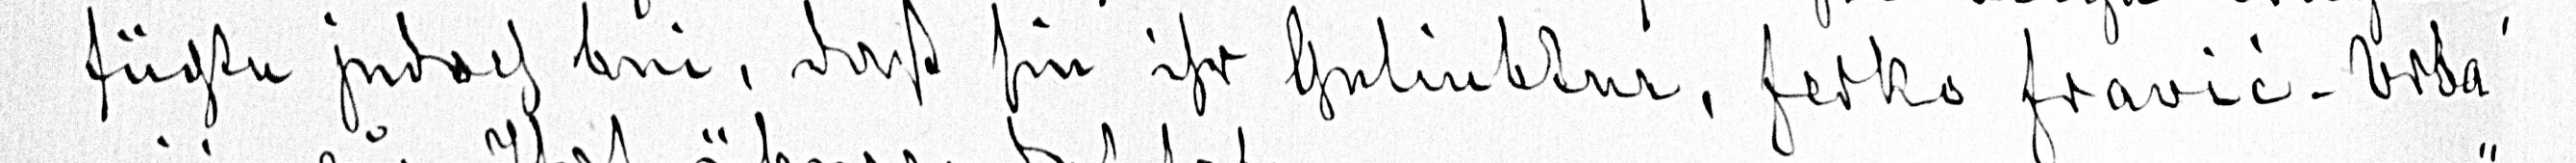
fügte jedoch bei, daß sie ihr Geliebter, Ferko Fravić-Vrbá¬
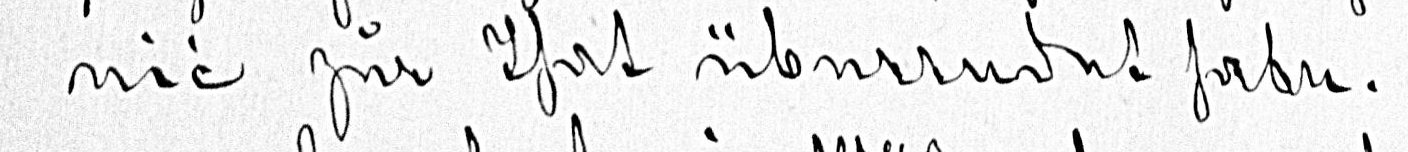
nić zur That überredet habe.
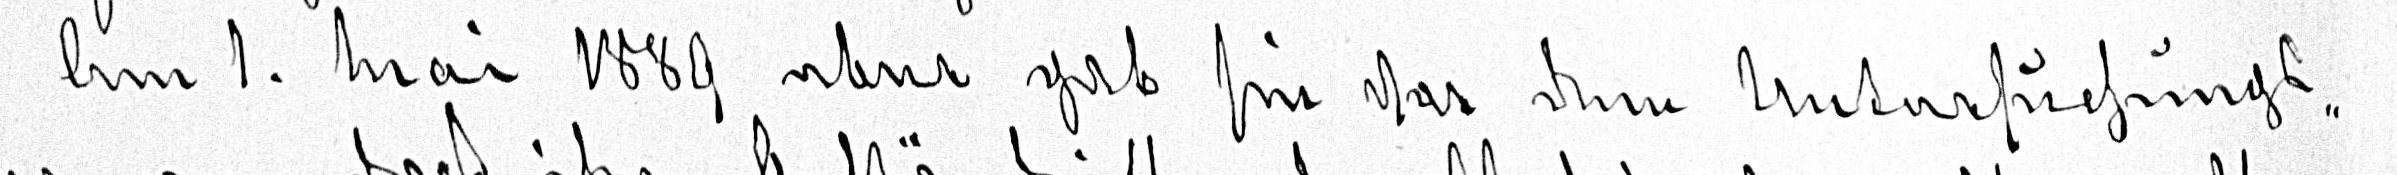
Am 1. Mai 1889 aber gab sie vor dem Untersuchungs¬
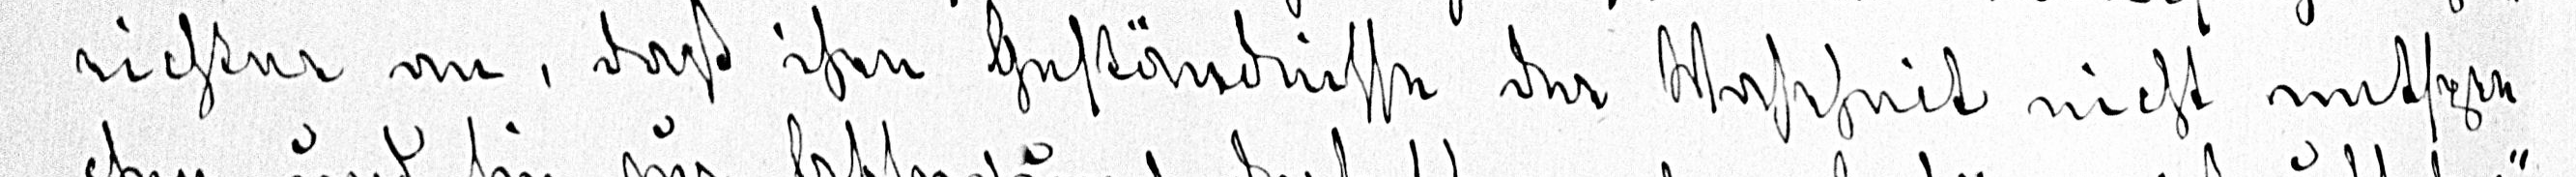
richter an, daß ihre Geständnisse der Wahrheit nicht entspre¬
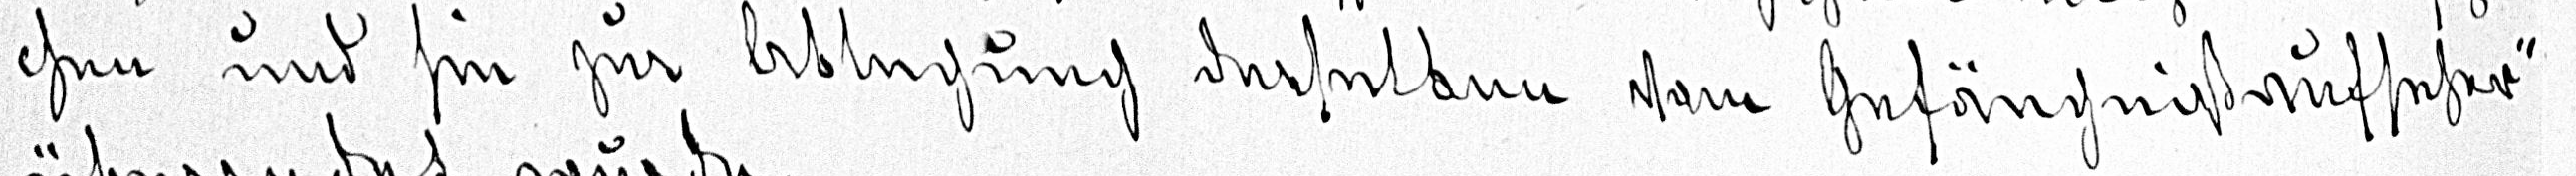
chen und sie zur Ablegung derselben vom Gefängnißaufseher
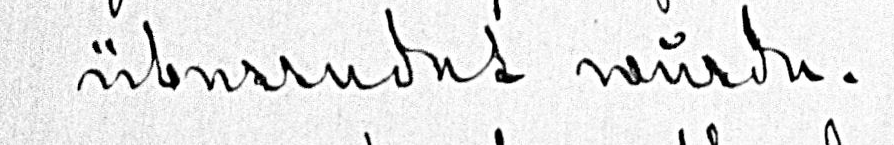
überredet wurde.
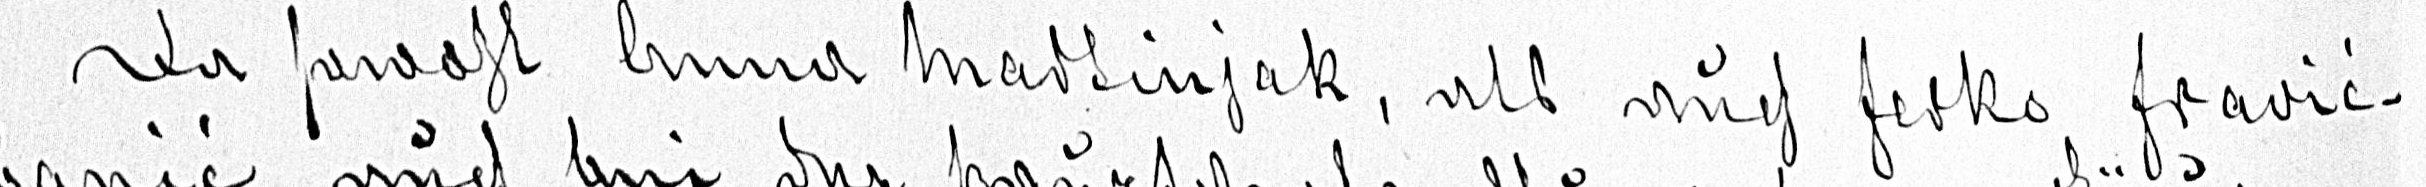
Da sowohl Anna Martinjak, als auch Ferko Fravić-
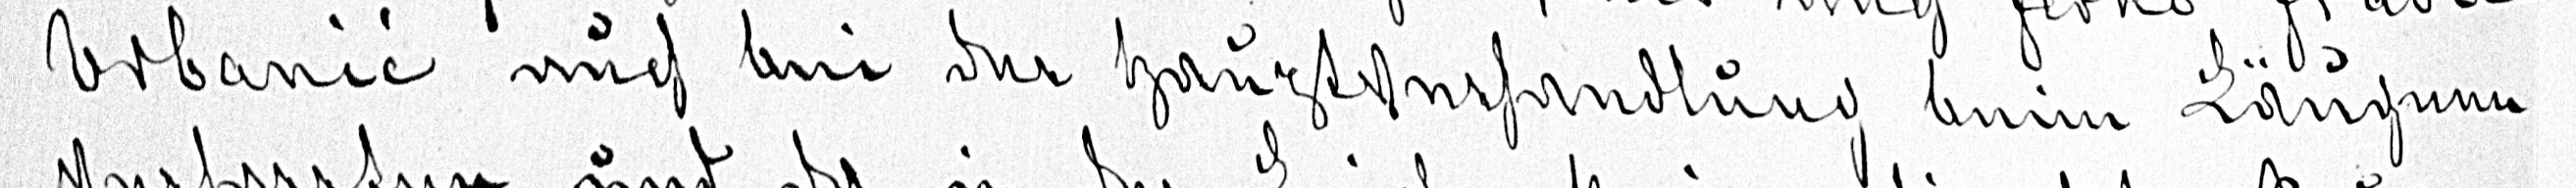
Vrbanić auch bei der Hauptverhandlung, beim Läugnen
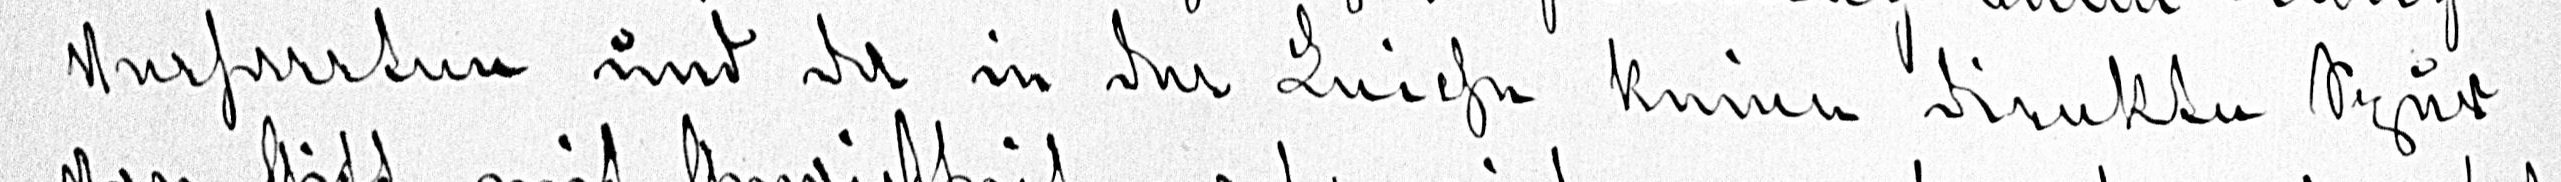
Verharrten und da in der Leiche keine direkte Spur
